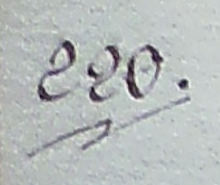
220.
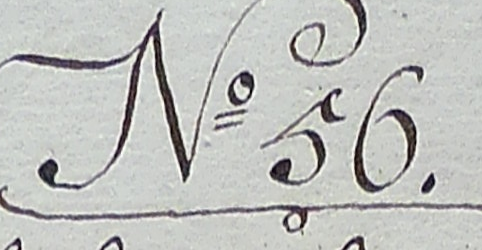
No͇ 56.
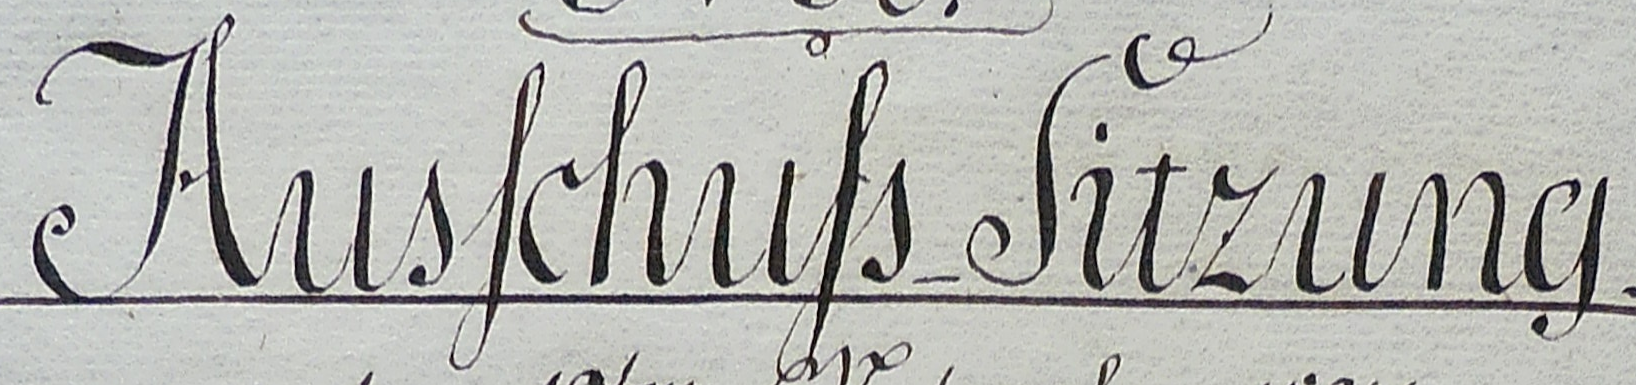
Ausschuss‗Sitzung
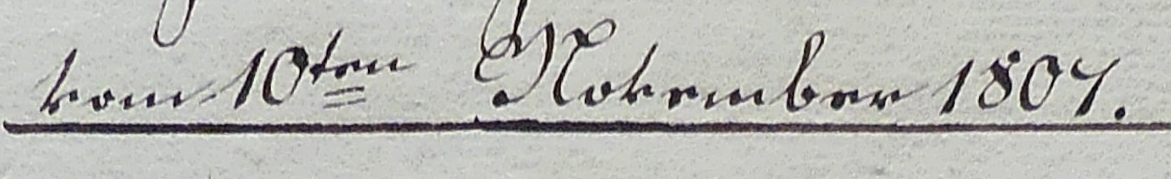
vom 10te͇n November 1807.
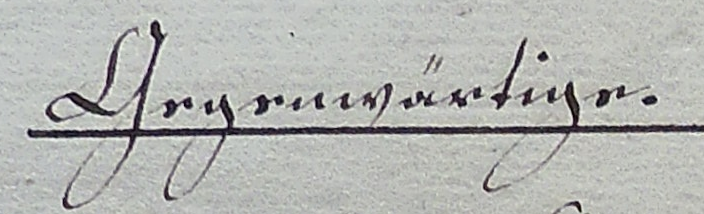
Gegenwärtige.
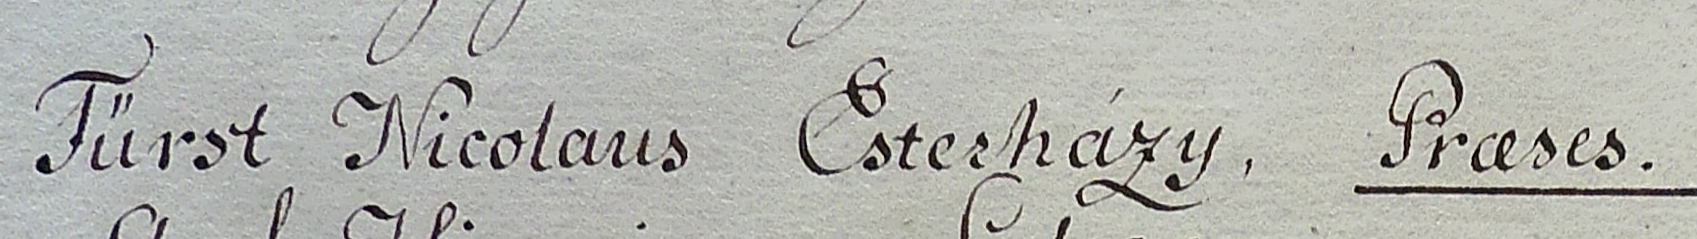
Fürst Nicolaus Esterházy, Præses.
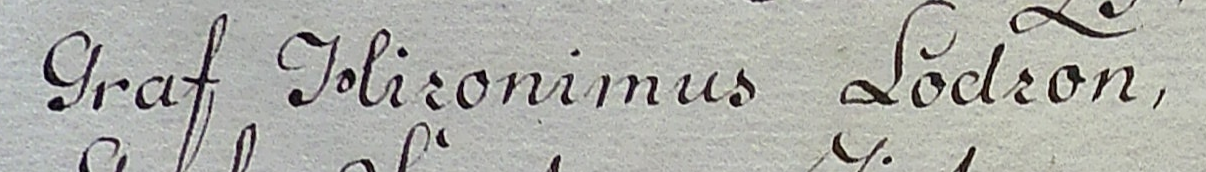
Graf Hironimus Lodron,
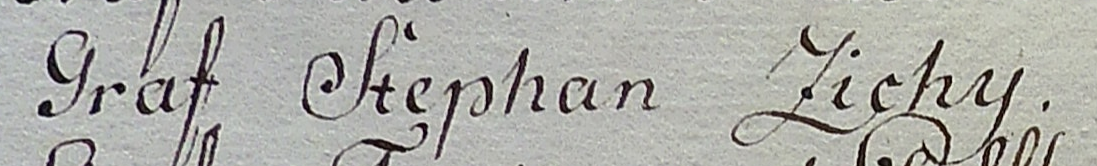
Graf Stephan Zichy.
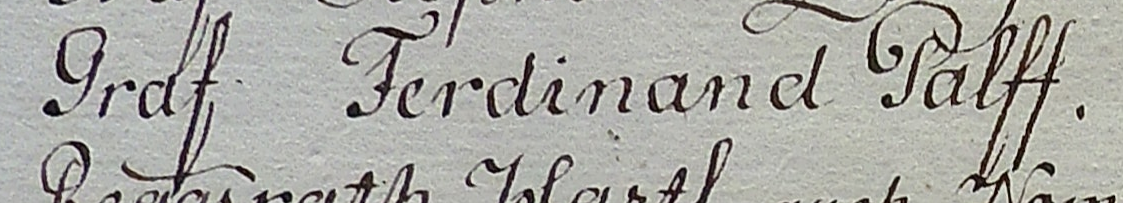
Graf Ferdinand Palff.
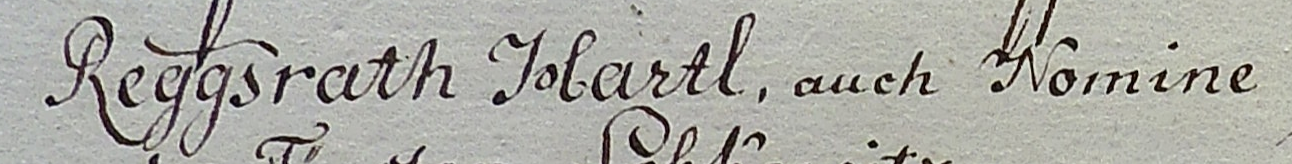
Reg͞gsrath Hartl, auch Nomine
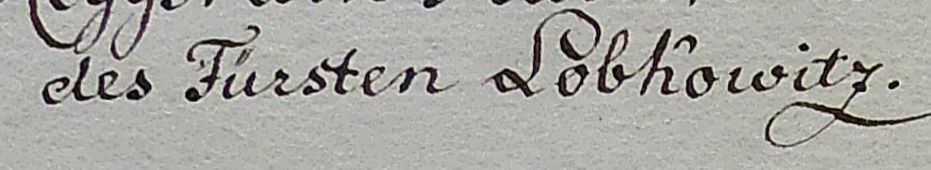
des Fürsten Lobkowitz.
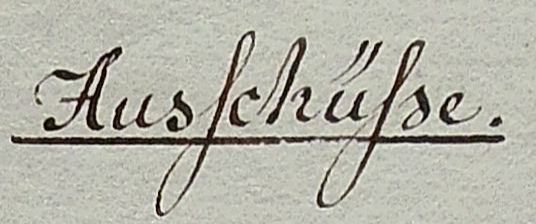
Ausschüsse.
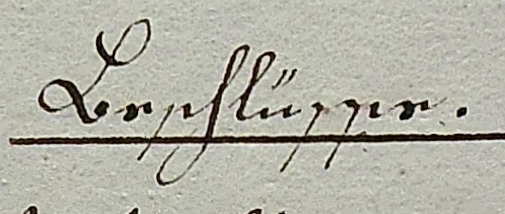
Beschlüsse.
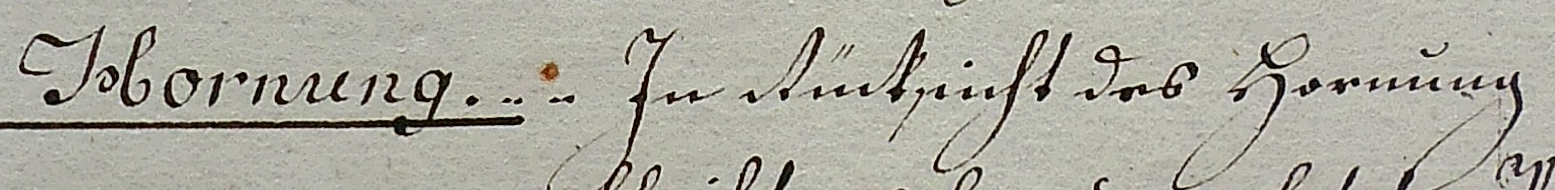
Hornung. .. .. In Rücksicht des Hornung
